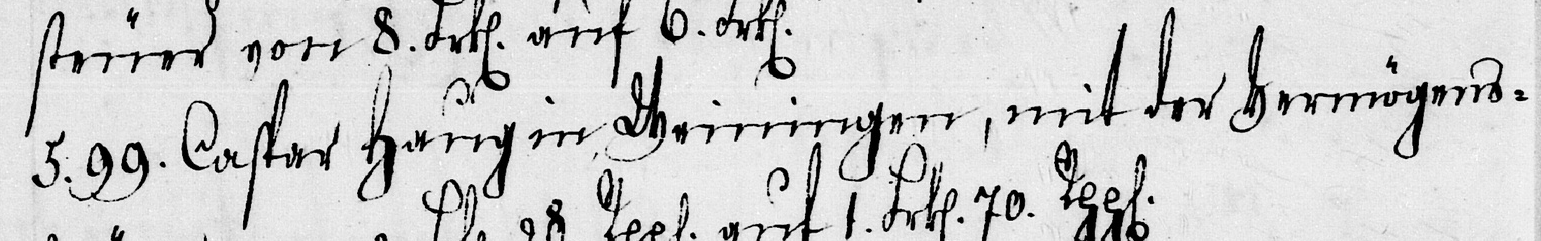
5. 99. Caspar Haug in Weiningen, mit der Vermögens¬
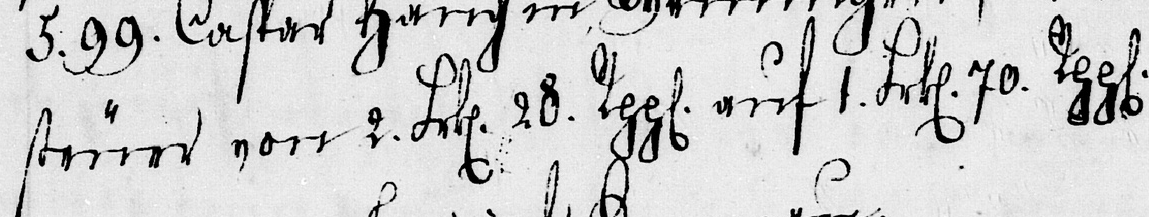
steuer von 2. Frk[en]. auf 1. Frk[en]. 50.
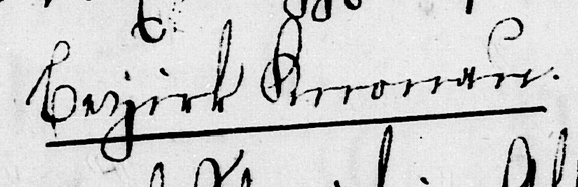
Bezirk Knonau.
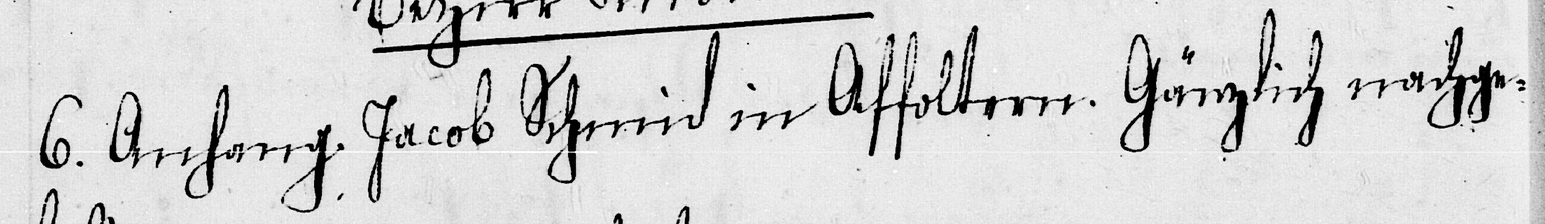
6. Anhang. Jacob Schmid in Affoltern. Gänzlich nachge¬
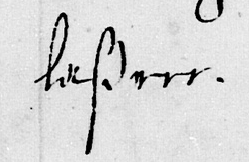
laßen.
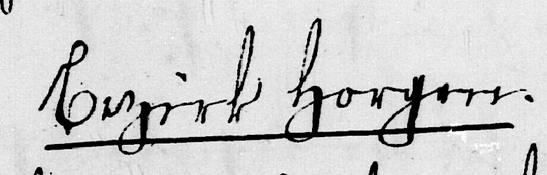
Bezirk Horgen.
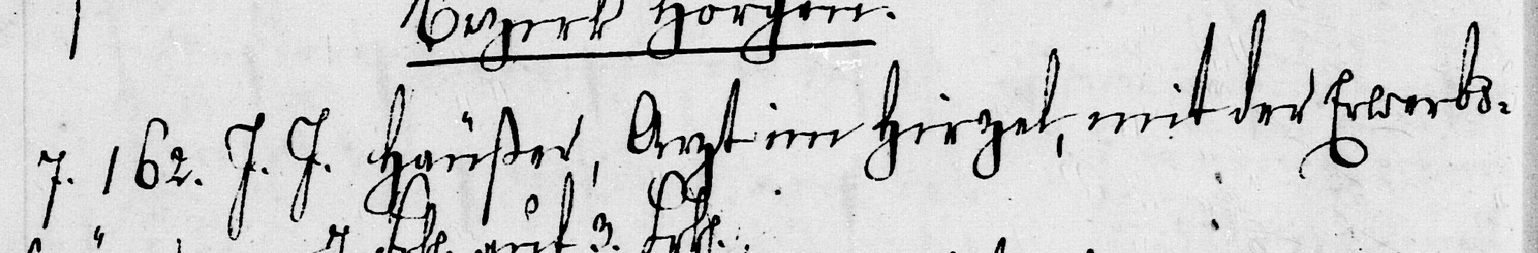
7. 162. J. J. Häußer, Arzt im Hirzel, mit der Erwerbs¬
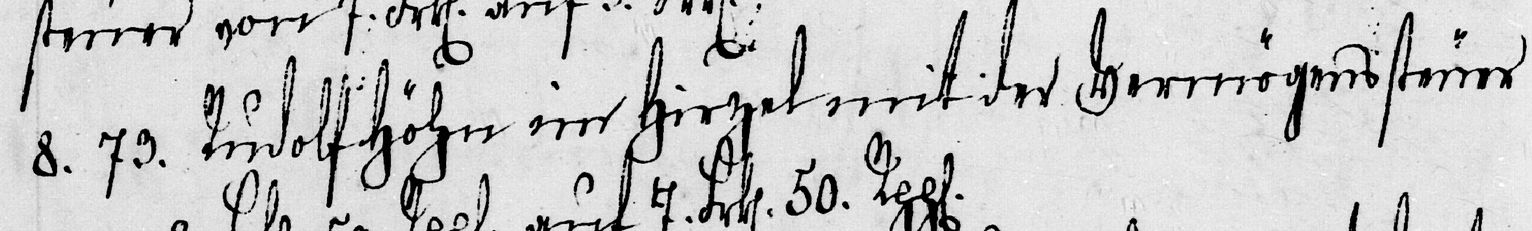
8. 73. Rudolf Höhn im Hirzel mit der Vermögenssteuer
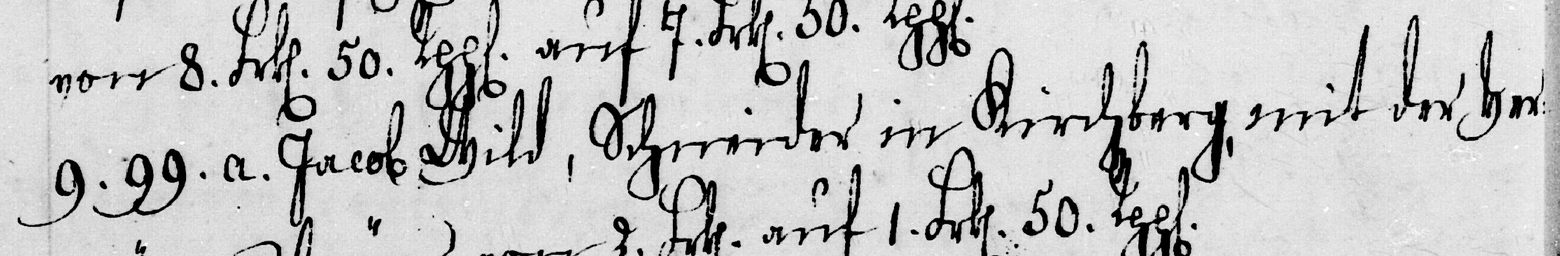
9. 99. a. Jacob Wild, Schneider in Kirchberg, mit der Ver¬
